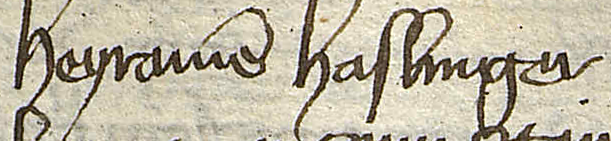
heyrame* haſlinger
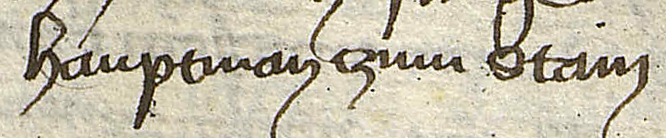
hauptman cʒum Stain
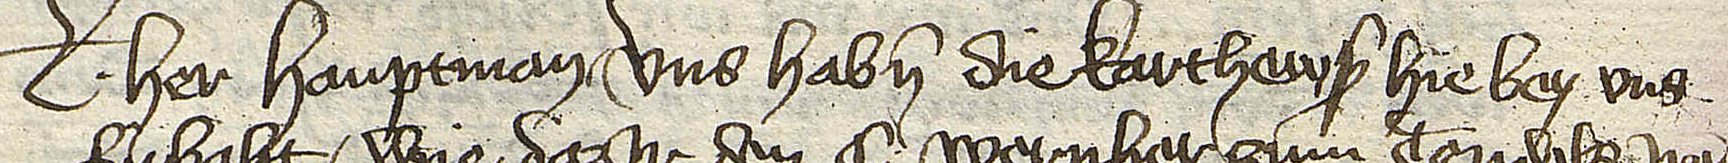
L* . her hauptman / vns habn* die karthewſ* hie bey vns
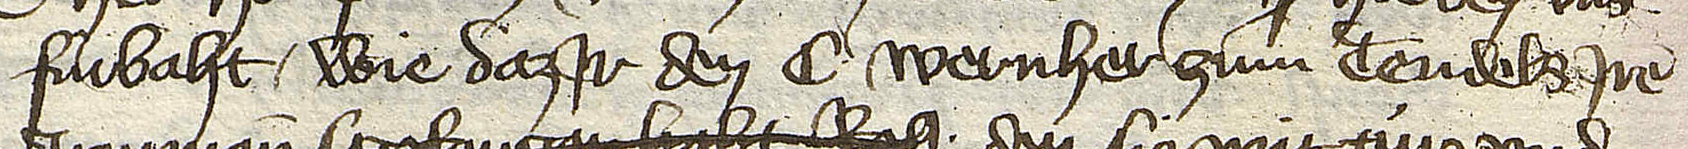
fürbaht / wie daʒ Ir den C . wernher cʒum Tendels Ire*
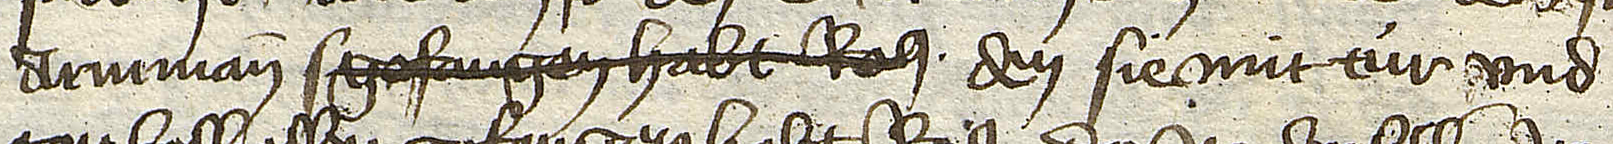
Armman* ſ gefangen habt Ro* . den ſie mit tür vnd
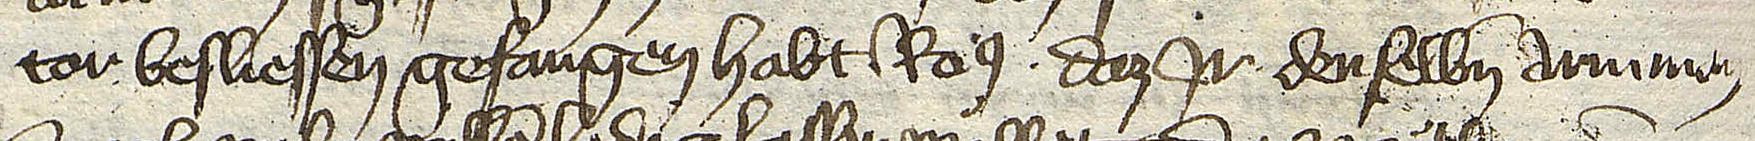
tor beſlieſſen gefangen habt Ro* . daʒ Ir denſelbn* Armman
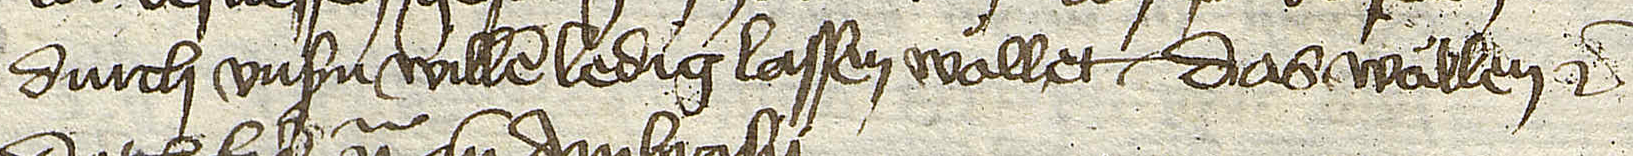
durch vnſ*n wille* ledig laſſen wöllet / Das wöllen ec*
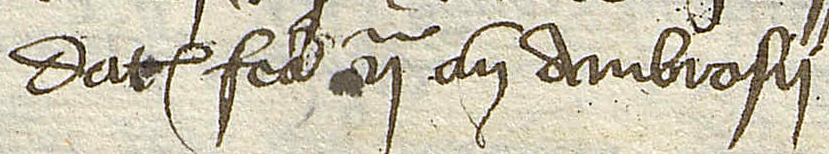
Dat* fea* ii* an* Ambroſii
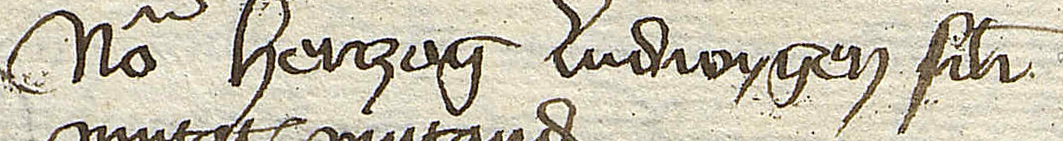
No* hercʒog Ludwygen ſilr*
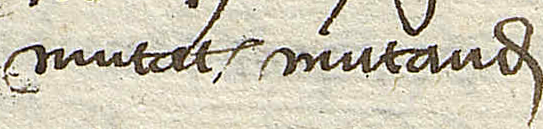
mutat* mutand*
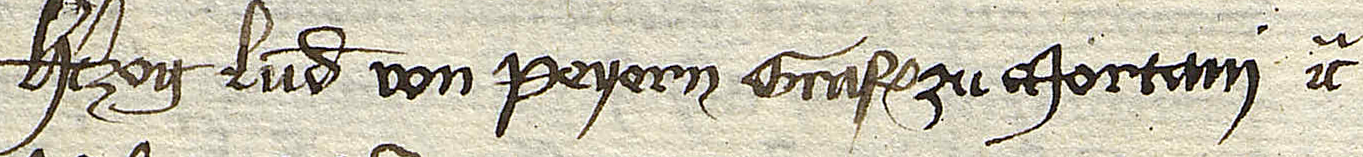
H*cʒog Lud* von Peyern Graf* ʒu Mortani ec*
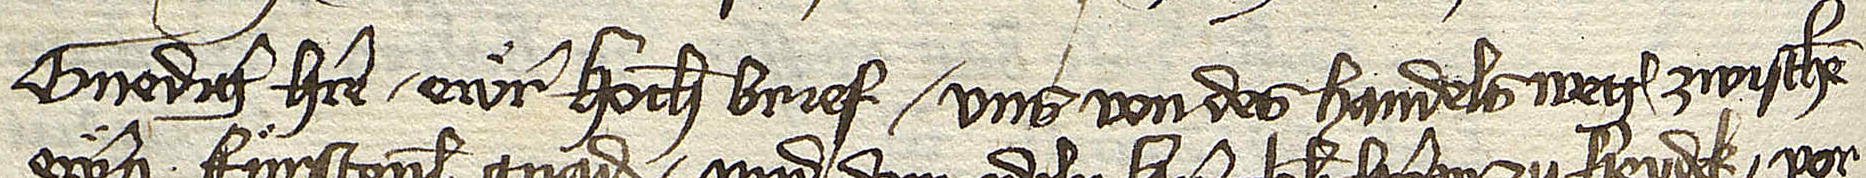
Gnedig* hr*e / ewr* Hoch* brief / vns von des handels weg* ʒwiſche*
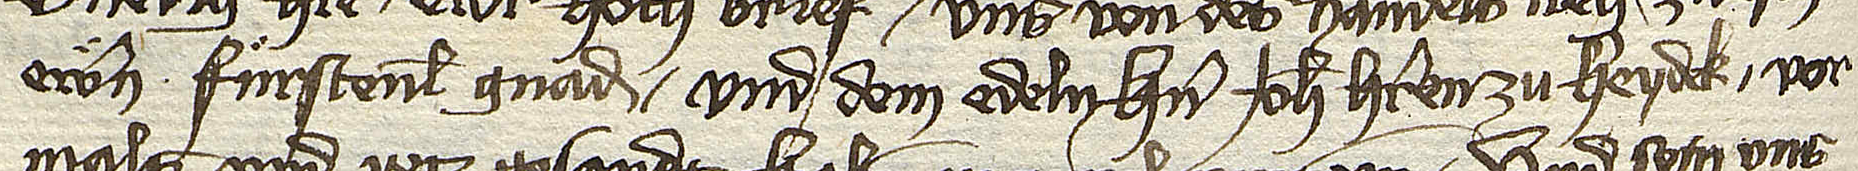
ew*n fürſtenl* gnad* / vnd dem edeln Hn* Ioh* hr*en ʒu heydek / vor
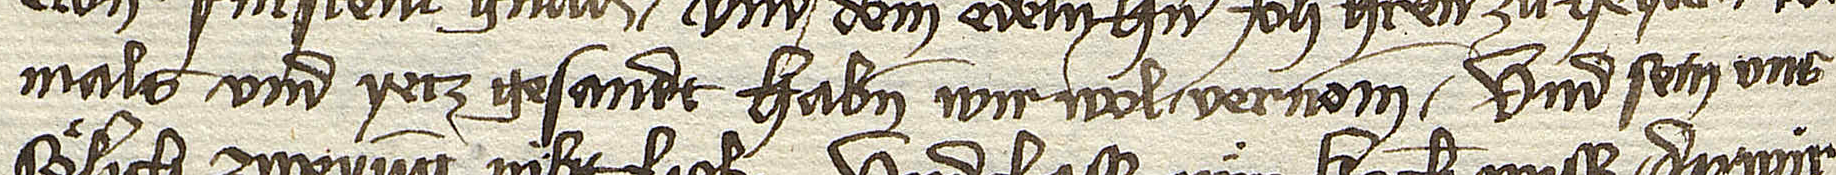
mals vnd yecʒ geſandt habn* wir wol vernom* / Vnd ſein vns
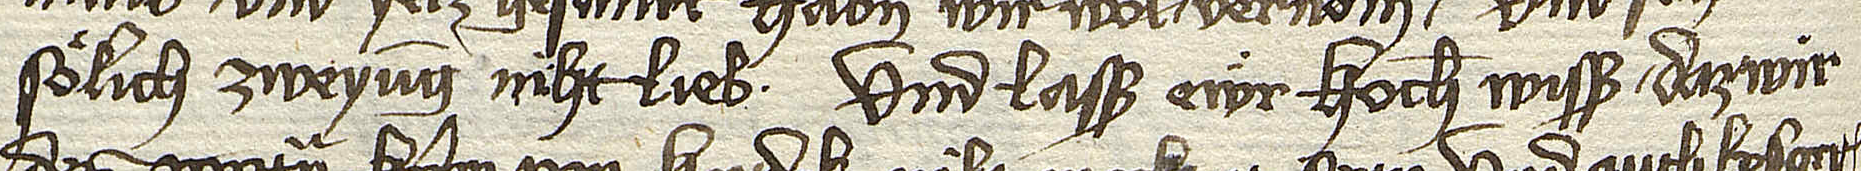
ſölich ʒweyug* niht lieb . Vnd laſſ* ewr Hoch* wiſſ* / daʒ wir
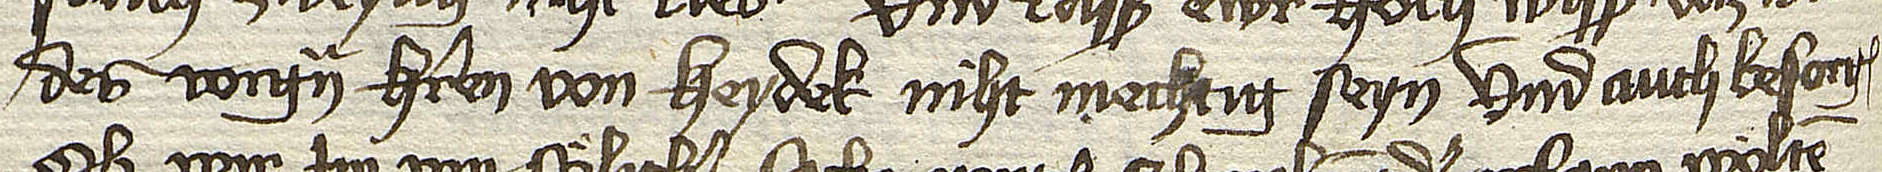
des vorn* hr*en von Heydek niht mechtig ſeyn Vnd auch beſorg*
